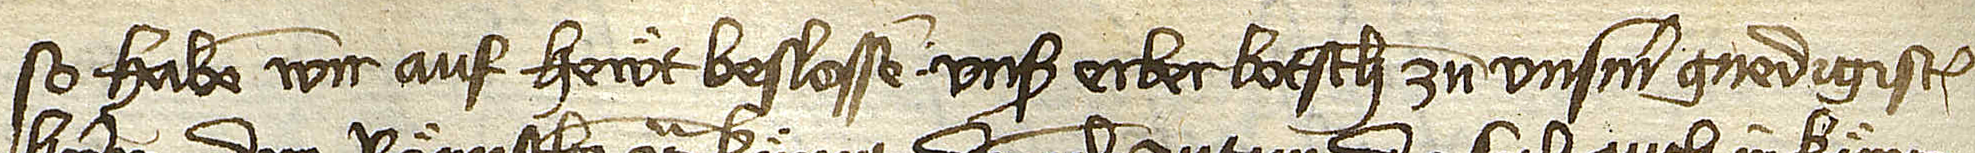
ſo habe* wir auf hewt beſloſſe* . vnſ* erber botſch* ʒu vnſ*m gnedigiſt*
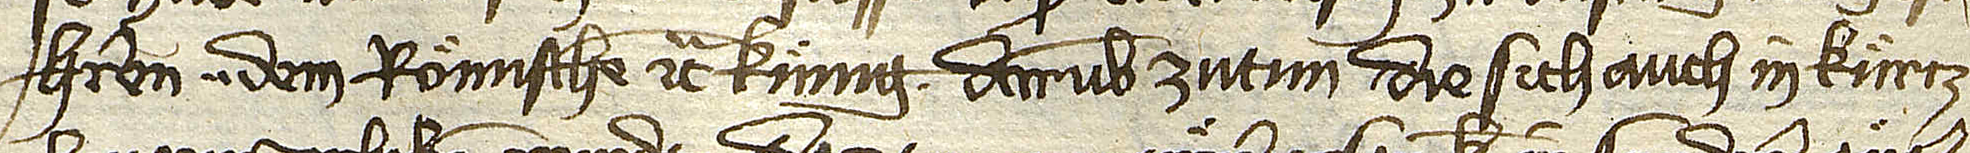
h*ren ~ dem Römiſche* ec* künig . Daru*b ʒutun / die ſich auch in kürcʒ
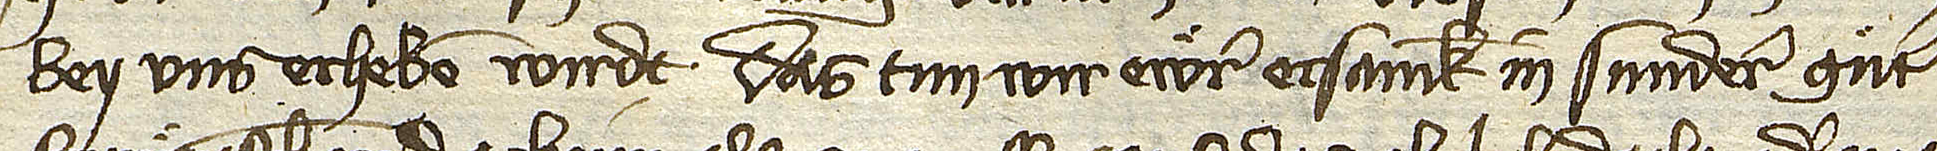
bey vns erhebe* wirdt . Das tun wir ewr erſamk* in ſunder* güt*
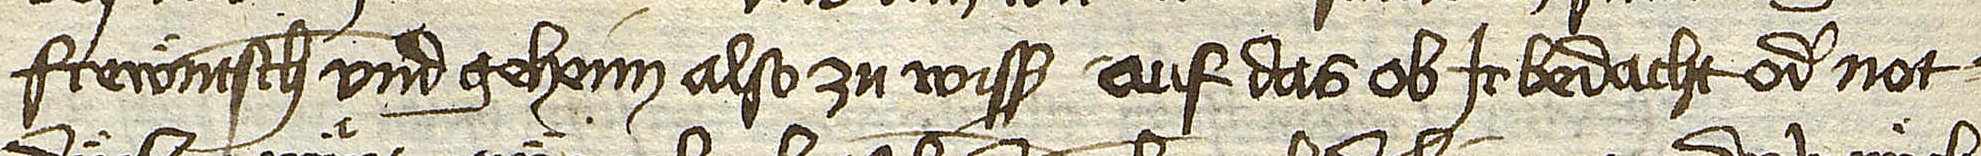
frewntſch* vnd geheim alſo ʒu wiſſ* / auf das ob Ir bedacht od* not =
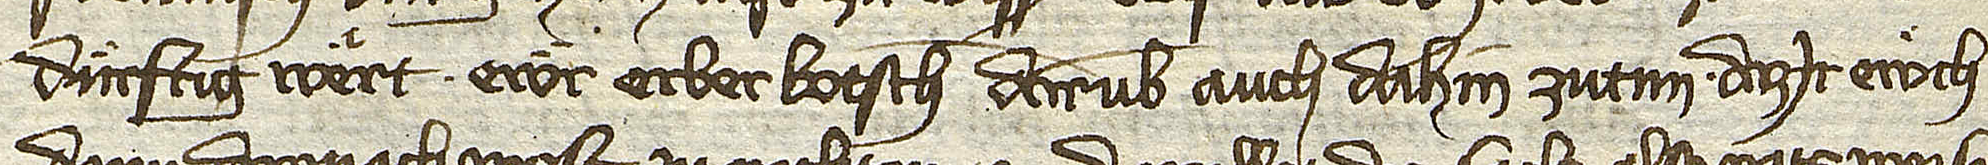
dürftig wërt . ewr erber botſch* daru*b auch dahin ʒutun . daʒ Ir ewch
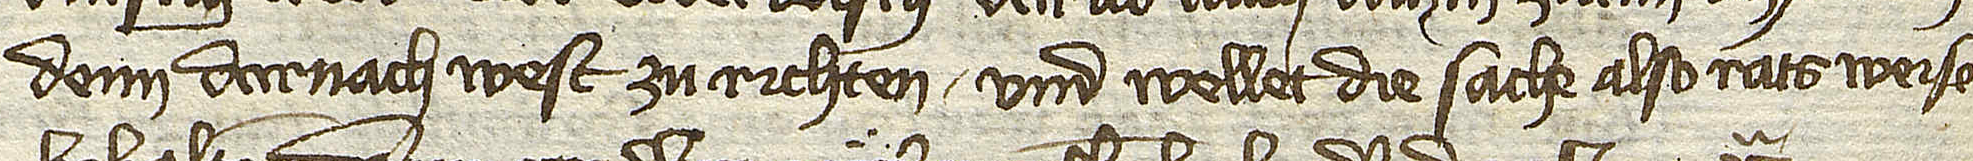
denn darnach weſt ʒu richten / vnd wellet die ſache alſo rats weiſe
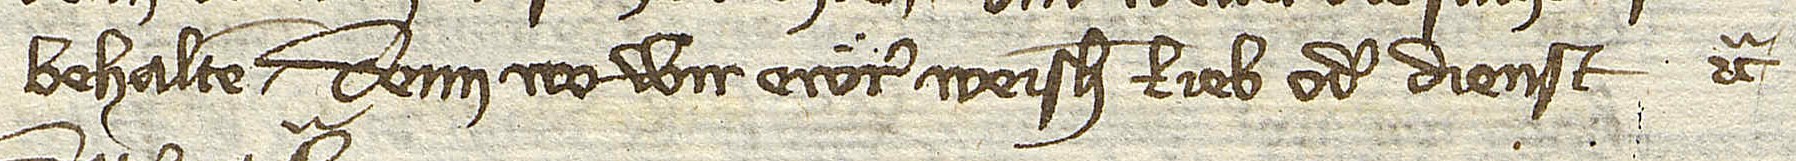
behalte* / Denn wo wir ewr* weiſh* lieb od* dienſt ec*
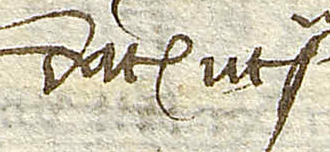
Dat* ut ſ*
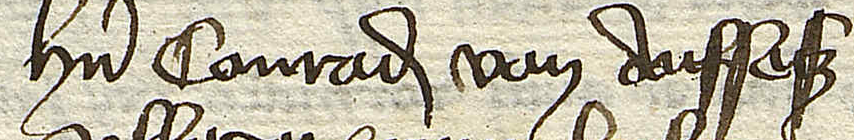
H*n Conrad* von Aufſeſʒ
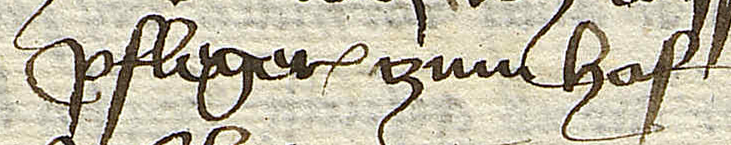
pfleger* cʒum hof
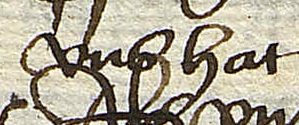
vns hat
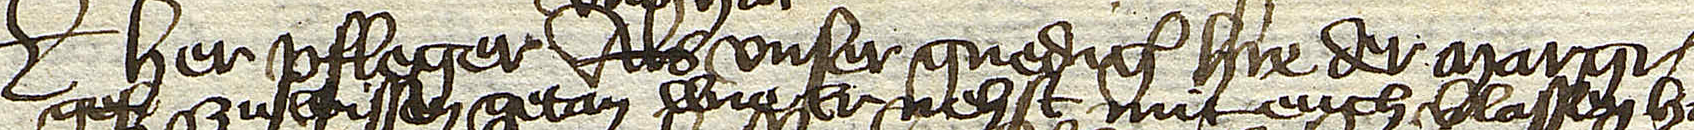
L* her pfleger Als vnſer gnedig* h*re der Margr*
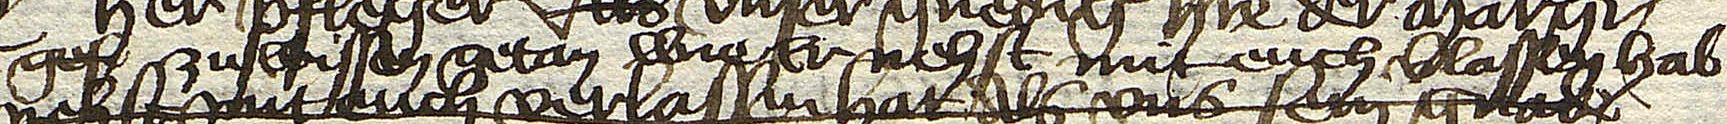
geſ* cʒu wiſſen getan wie Er nehſt mit euch v*laſſen hab
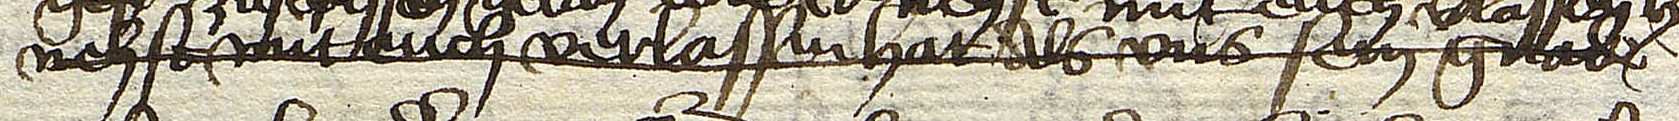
nehſt mit euch verlaſſen hat Als vns ſein gnade
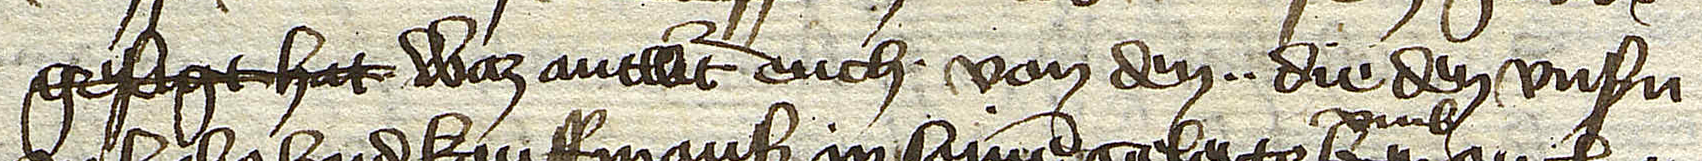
geſagt hat Waʒ antw*t euch . von den ~ die den vnſ*n
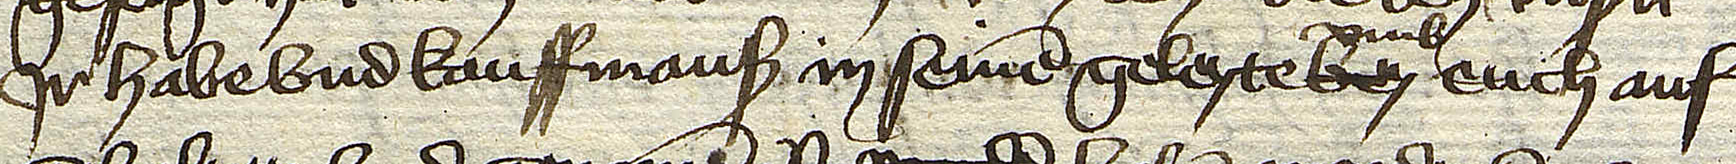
Ir habe vnd kauffmanſ* in ſeine* geleyte bey euch auf
